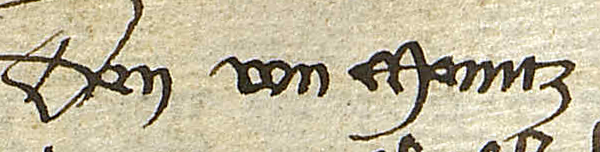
Den von Meincʒ
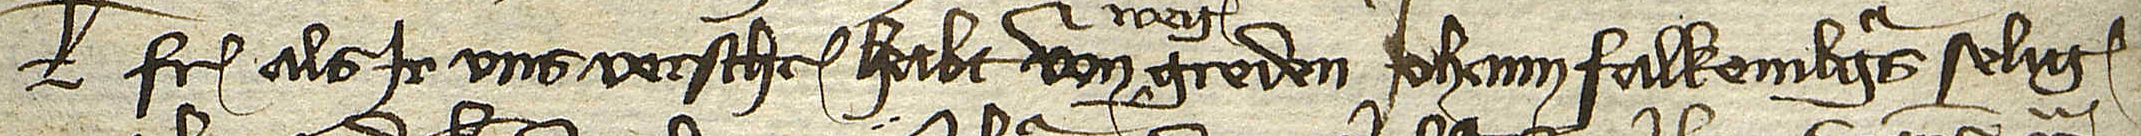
L* fr* als Ir vns verſchr* habt Von greden Iohann falkembg*s ſelig*
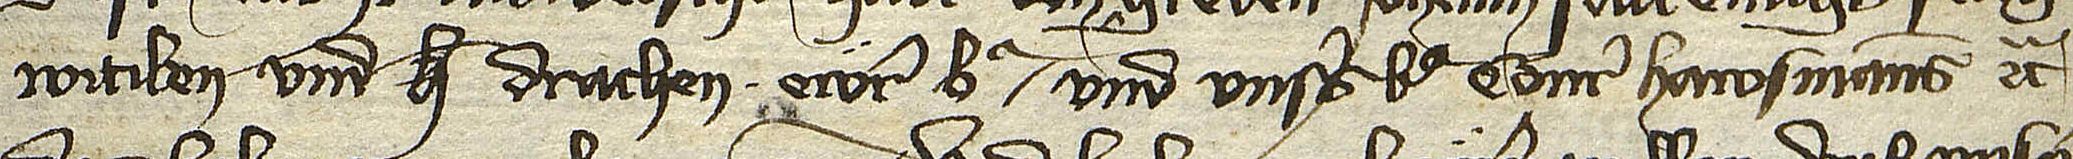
witiben vnd h* drachen . eẅr b* vnd vnſ*s b* Conr* hawſmans* ec*
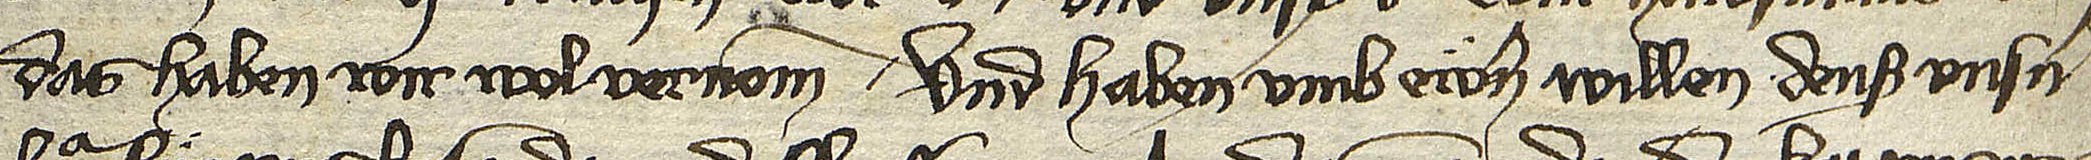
das haben wir wol vernom* / Vnd haben vmb eẅ*n willen denſ* vnſ*n
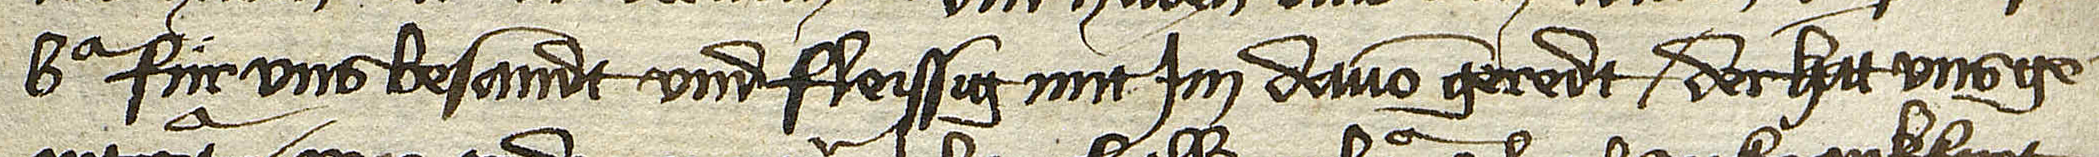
b* für vns beſandt vnd fleiſſig mit Im dauo* geredt / der hat vns ge =
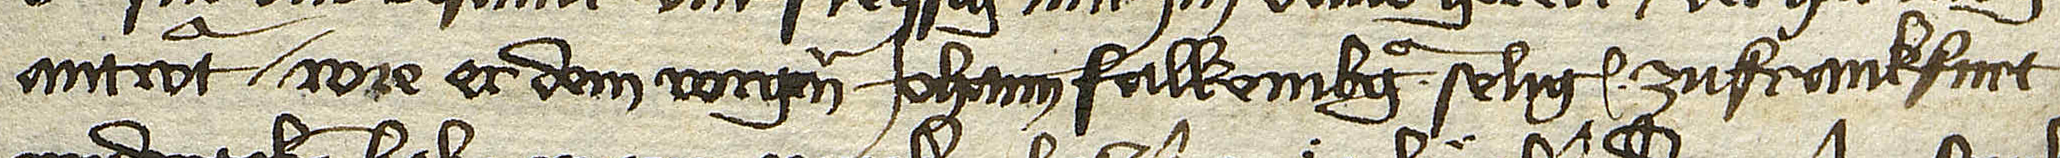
antw*t / wie er dem vorgen* Iohann falkembg* ſelig* ʒu frankfurt
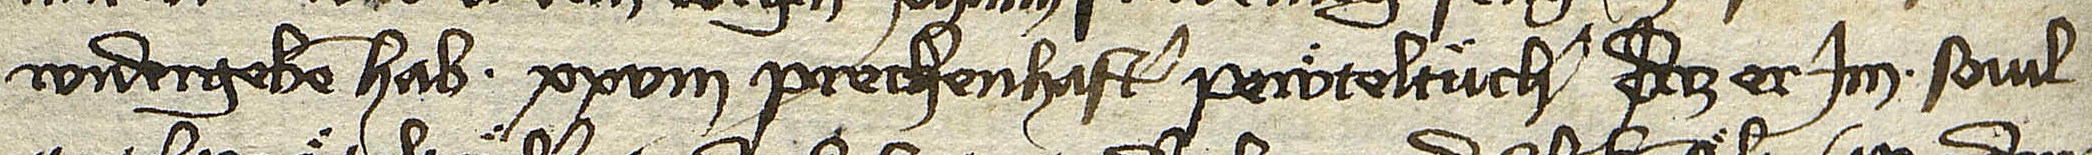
widergebe* hab . xxviii prechenhaft* peẅteltüch* Daʒ er Im . ſouil
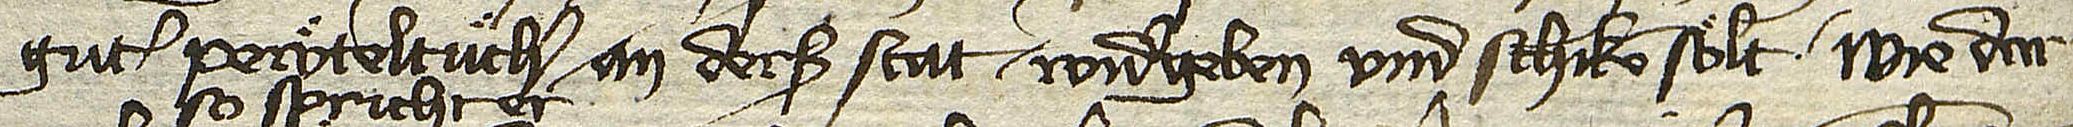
gut* peẅteltüch* an derſ* ſtat / wid*geben vnd ſchik* ſölt . / wie dar =
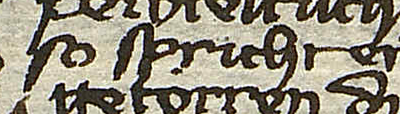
ſo ſpricht er
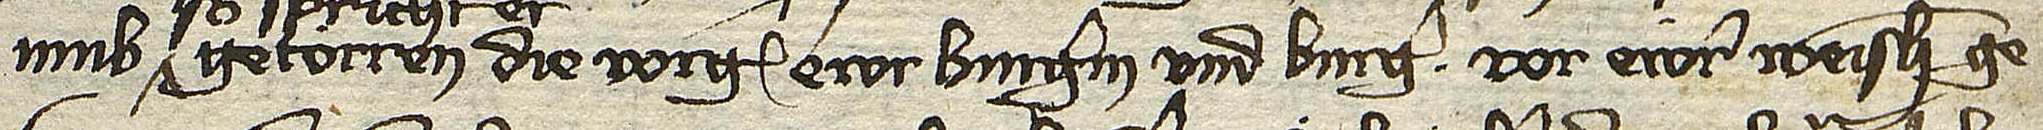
umb getörren die vorg* ewr burg*in vnd burg* . vor eẅr* weiſh* ge =
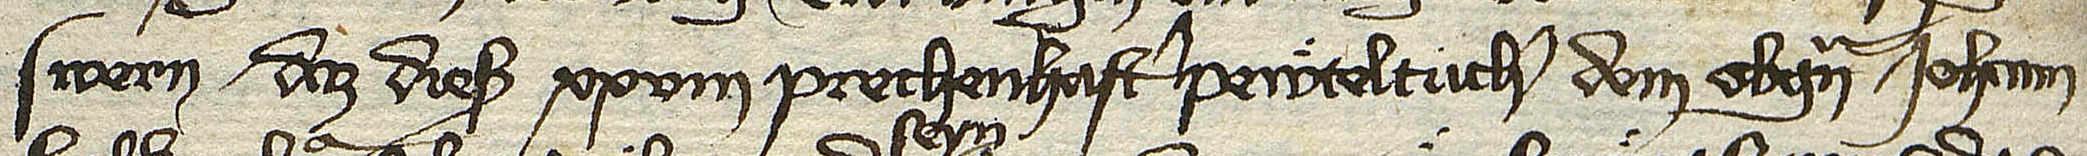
ſwern / daʒ dieſ* xxviii prechenhaft* peẅteltuch* dem obg*n Iohann
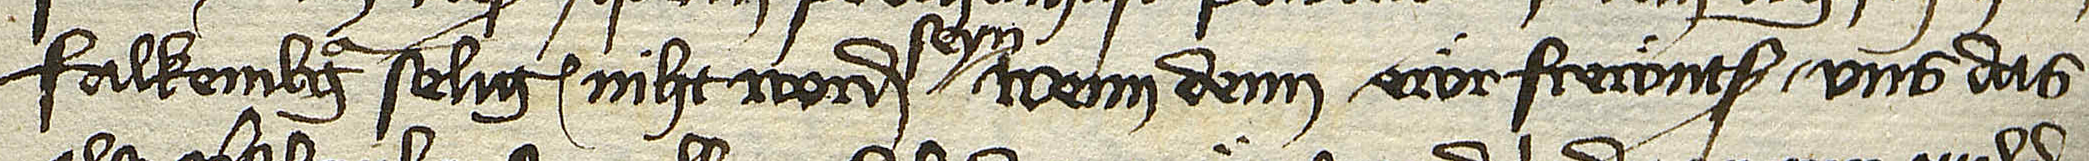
falkemb*g ſelig* niht word* / wenn denn eẅr freẅntſ* / vns das
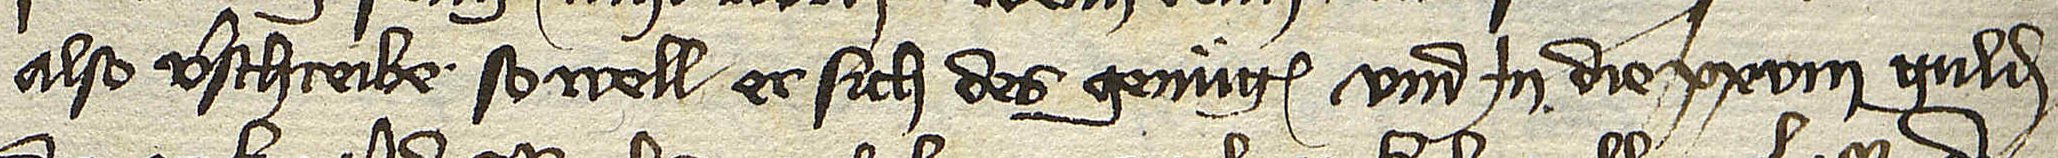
alſo v*ſchreibe . ſo well er ſich des genüg* vnd In die xxviii guld*
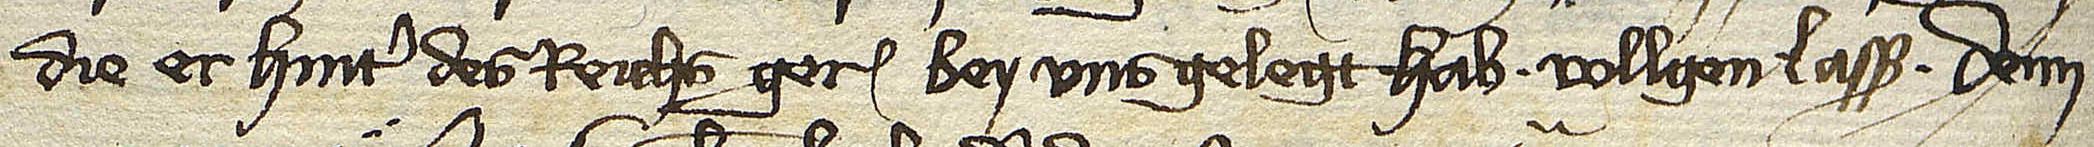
die er hint* des Reichs ger* bey vns geleyt hab . vollgen laſſ* . Denn
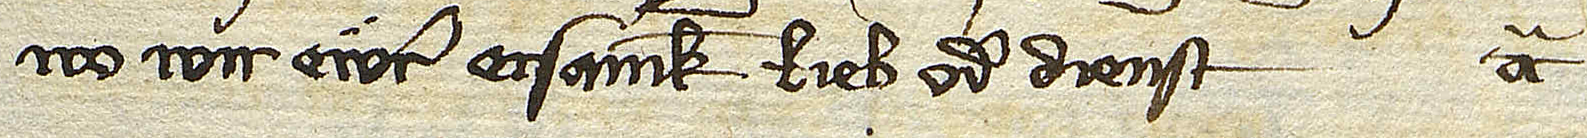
wo wir eẅr* erſamk* lieb od* dienst ec*
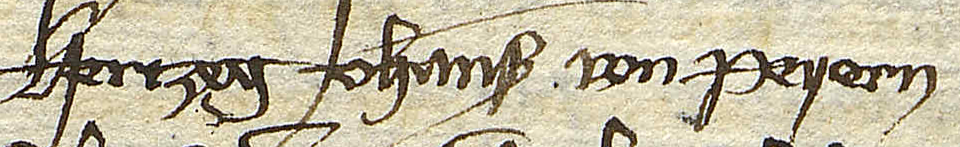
Herʒog Iohannſ* von Peyern
